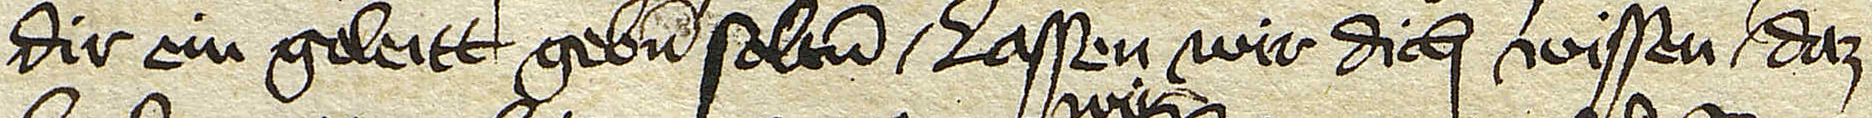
dir ein geleitt gebn* ſoltn* / Laſſen wir dich wiſſen / daʒ
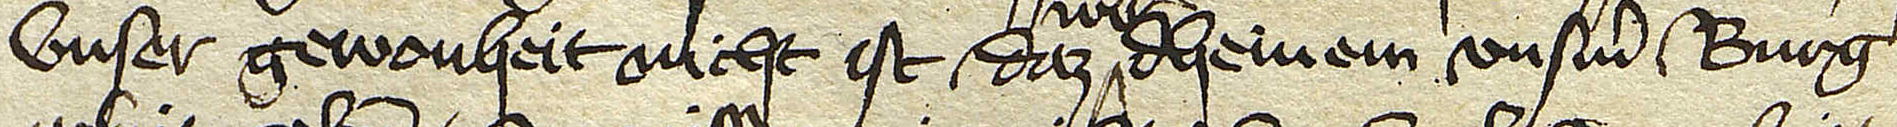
vnſer gewonheit nicht iſt / daʒ dheinem vnſm* Burg*
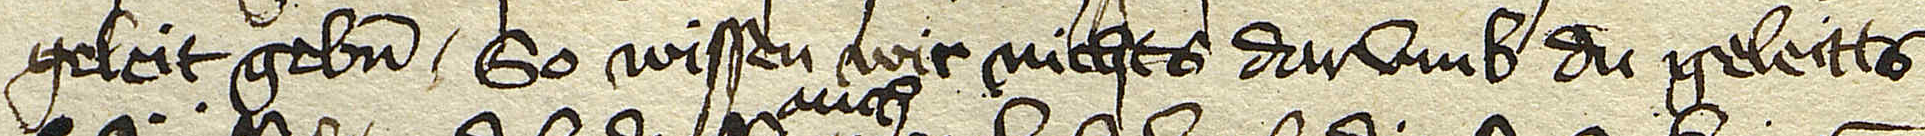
geleit gebn* / So wiſſen wir nichts darvmb du geleits
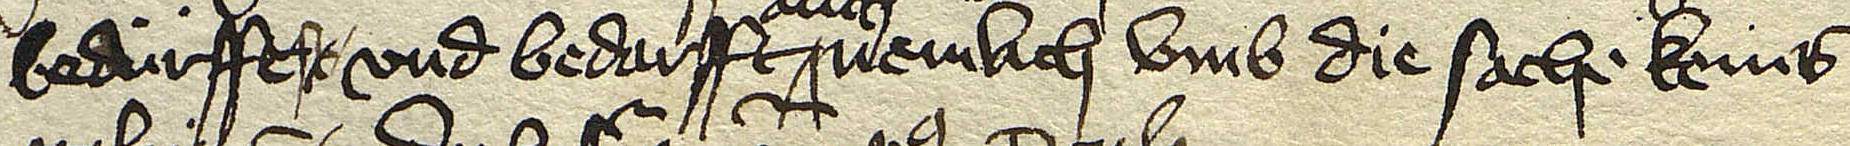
bedürffeſt / vnd bedarfft nemlich vmb die ſache keins
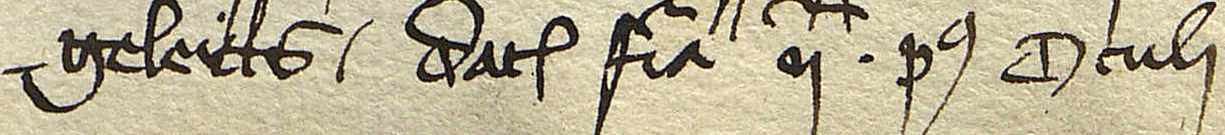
geleitts / Dat* fia* ii* . p* Oculi
